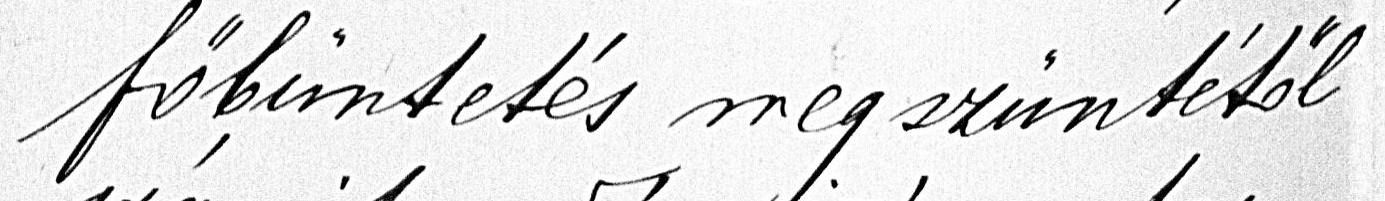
föbüntetés megszüntétöl
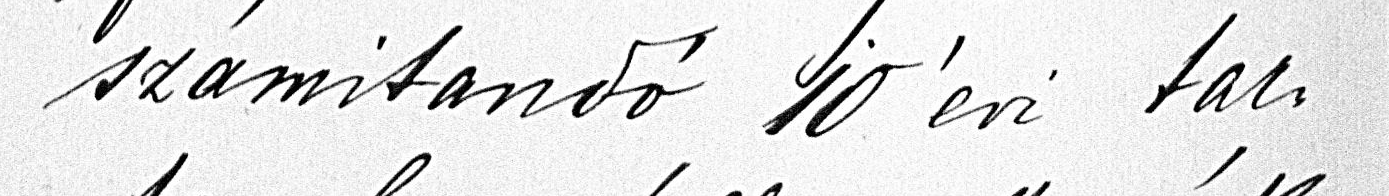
számitandó 10 eri tar¬
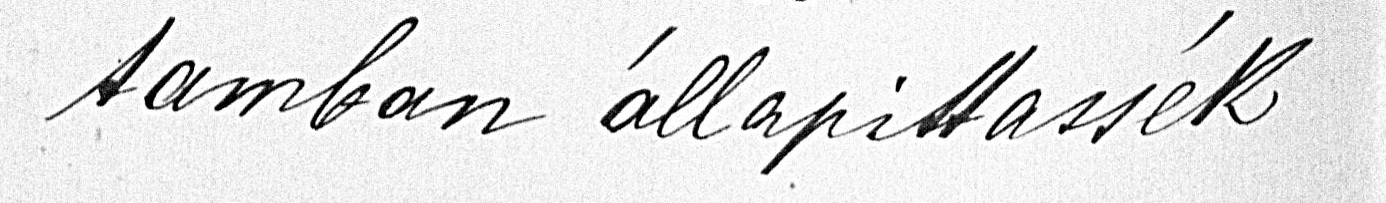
tamban állapittassék
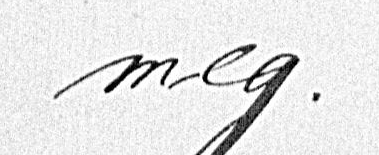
meg.
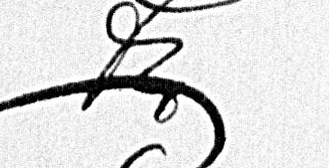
xx
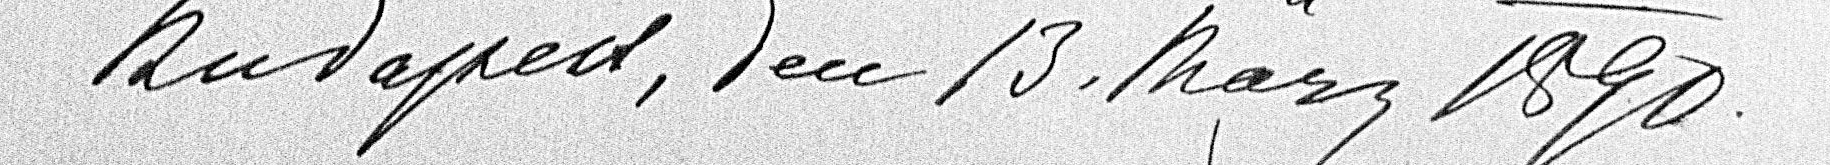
Kudapert, den 13. März 1890.
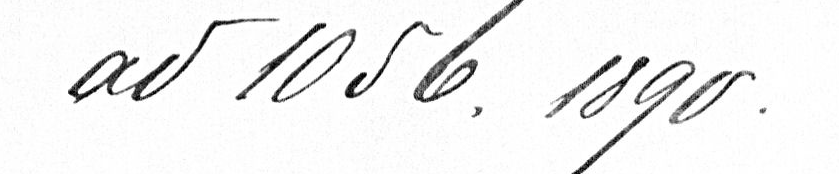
ad 1056. 1890.
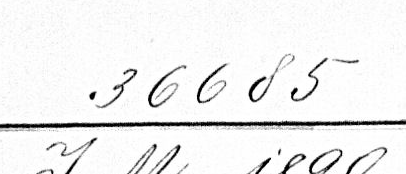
36685
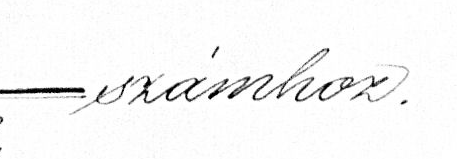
számhoz.
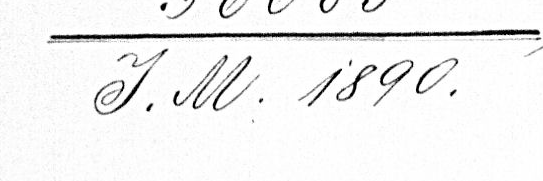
J. M. 1890.
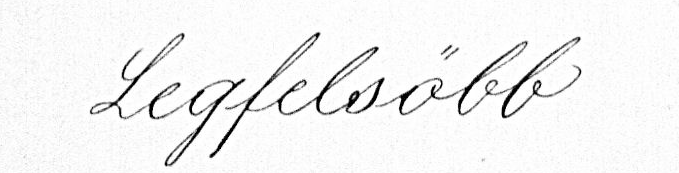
Legfelsöbb
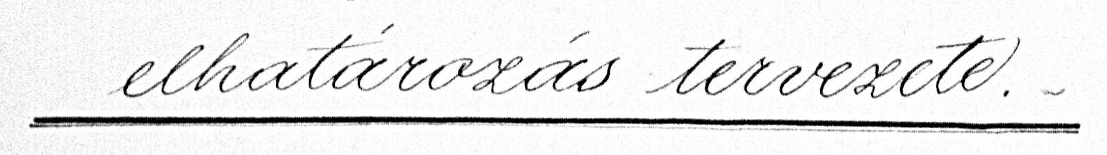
elhatározás tervezete.
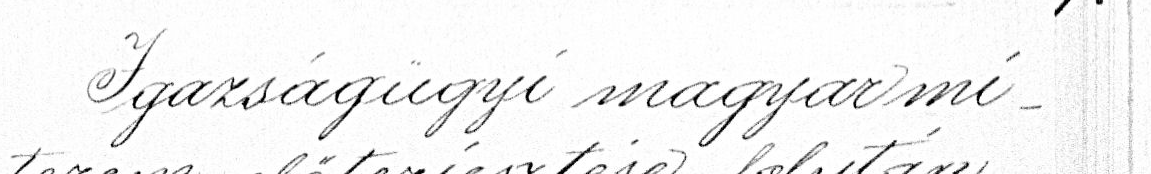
Jgazságügyi magyarmi¬
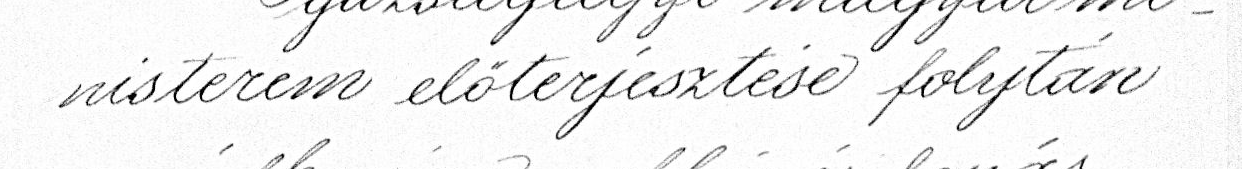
nisterem elöterjesztése folytán
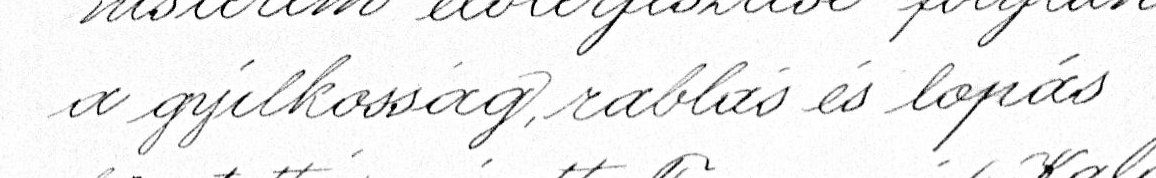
a gyilkosság, rablás és lopás
